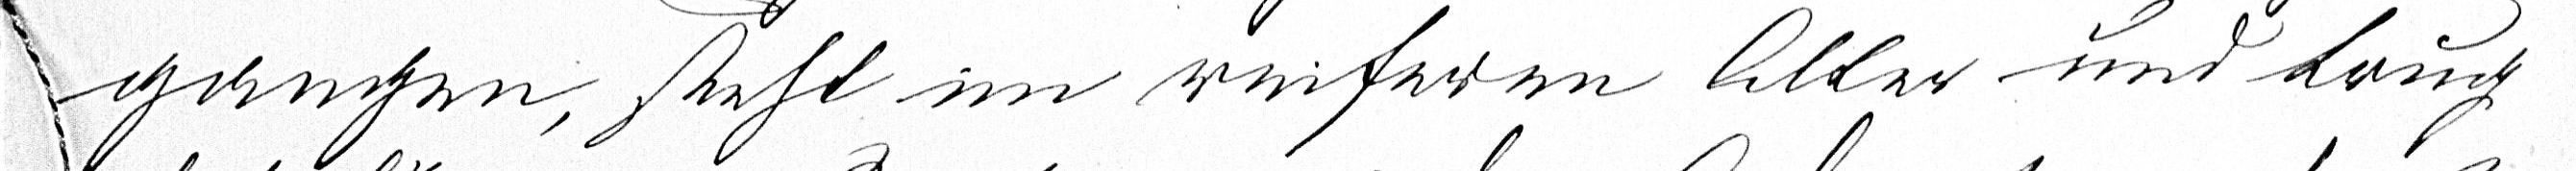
gangen, steht im reiferen Alter und Leug
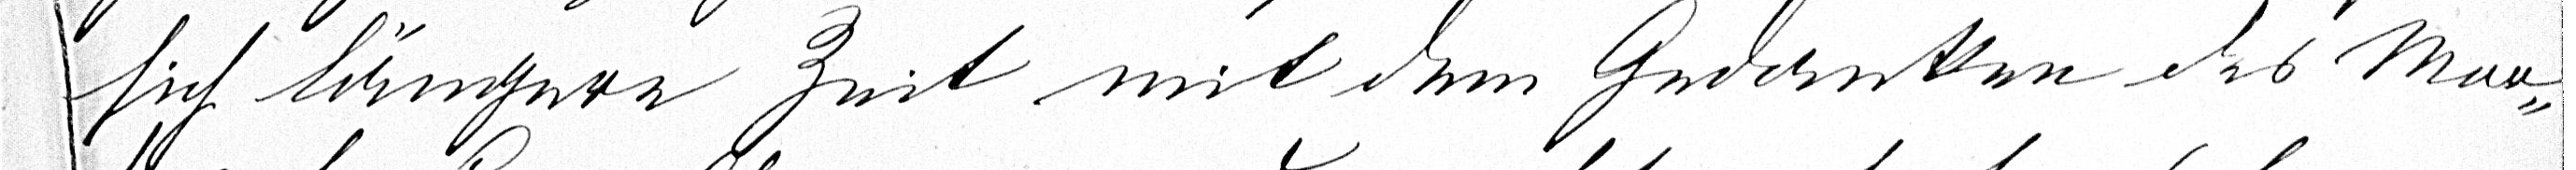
sich längere Zeit mit dem Gedanken des Mor¬
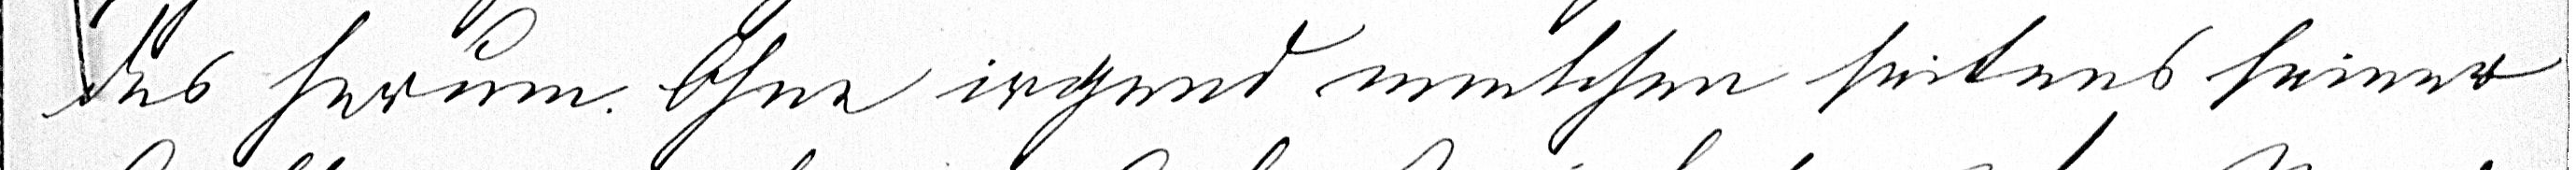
des herum. Ohne irgend welchen seitens seiner
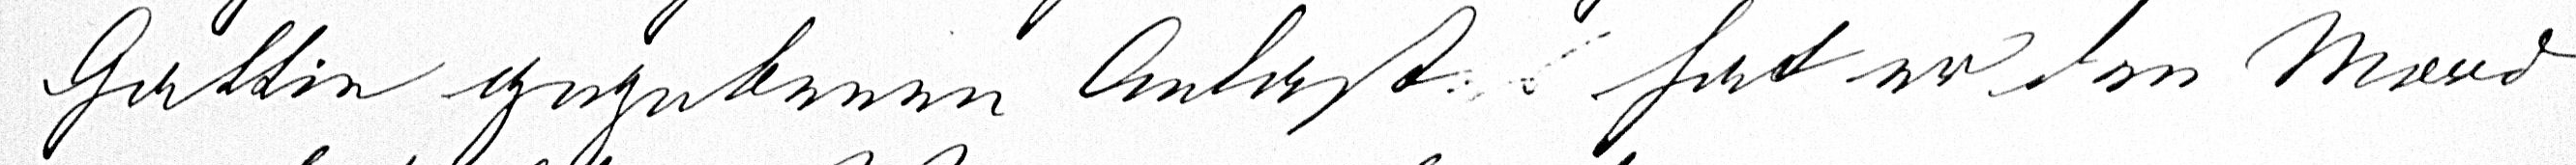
Gattin gegebenen Anlaß xx hat er den Mord
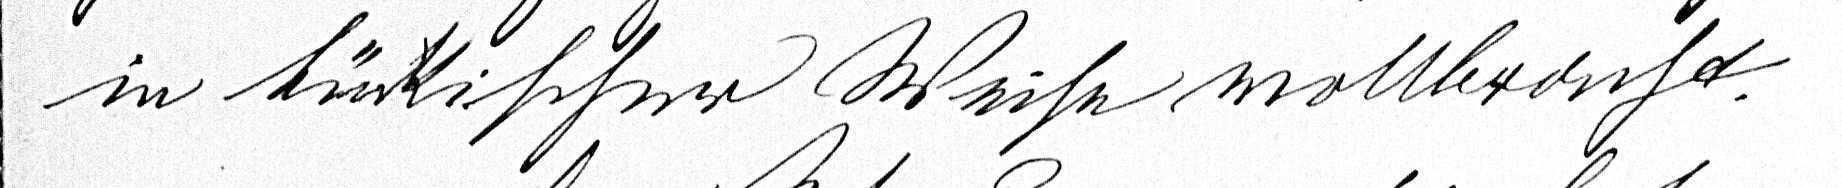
in xxürkischer Weise vollbracht.
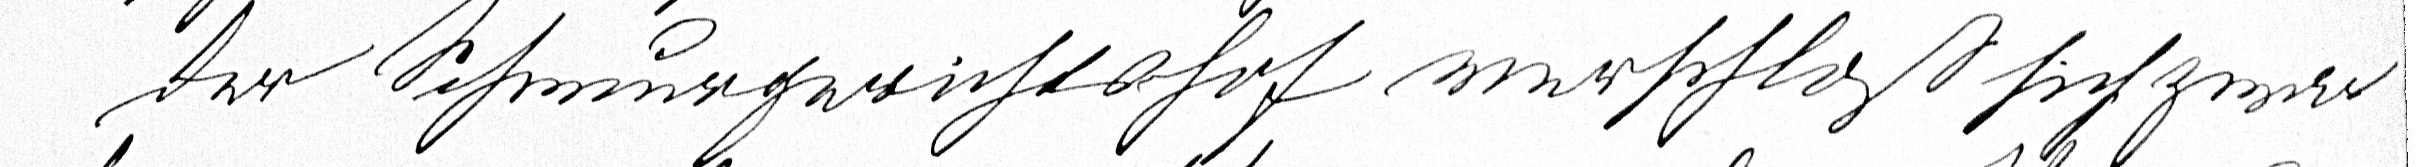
Der Schwurgerichtshof verschloß sich zwar
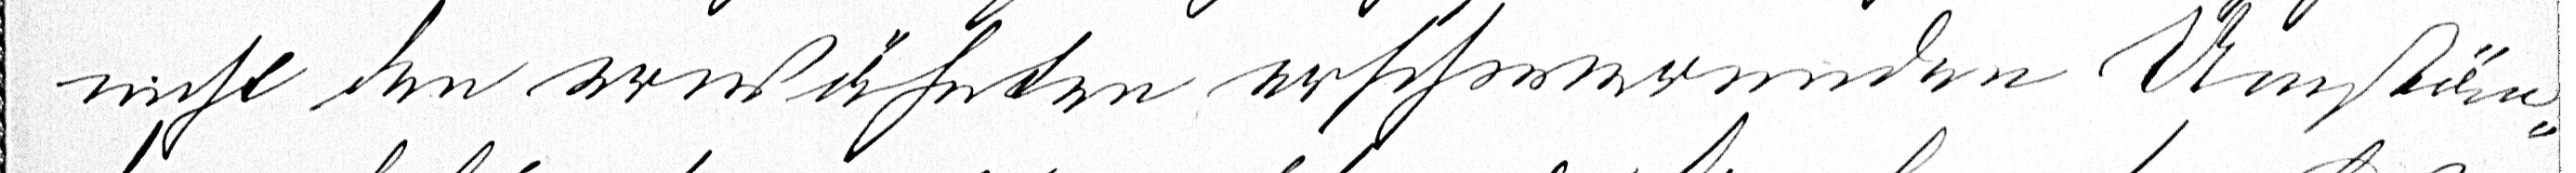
nicht den xxähnten erschwerenden Umstän¬
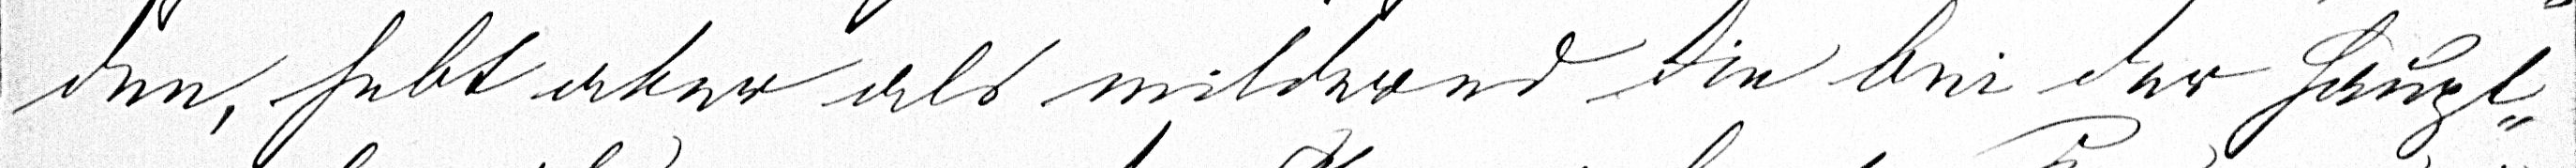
den, hebt aber als mildernd die bei der Haupt¬
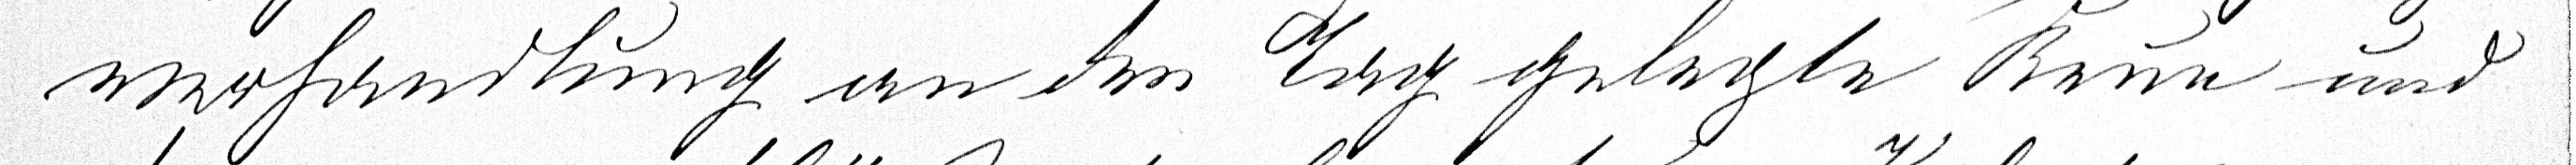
verhandlung an den Tag gelegte Reue und
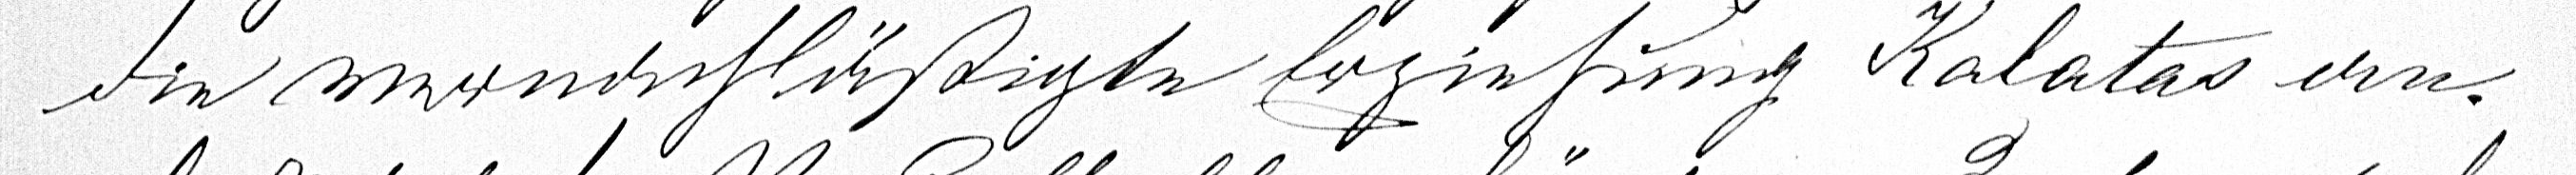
die vernachläßigte Erziehung Kalatas an.
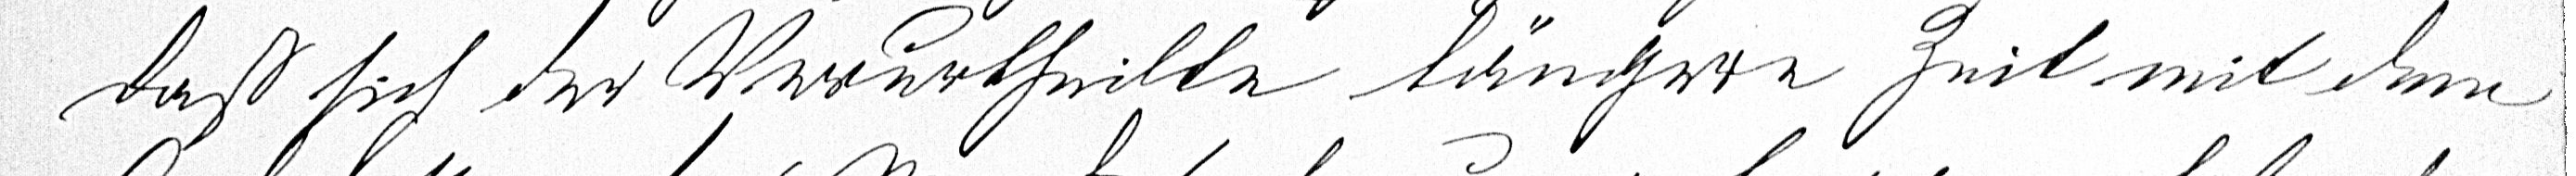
Daß sich der Verurtheilte längere Zeit mit dem
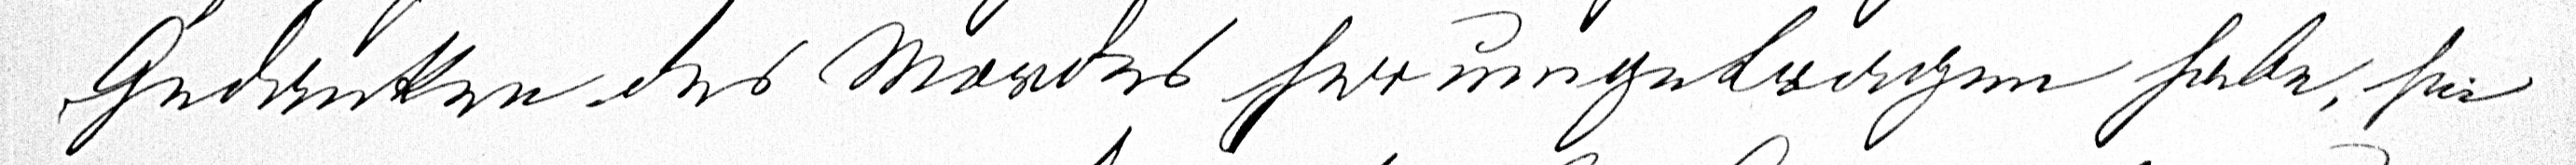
Gedanken des Mordes herumgetragen habe, sie
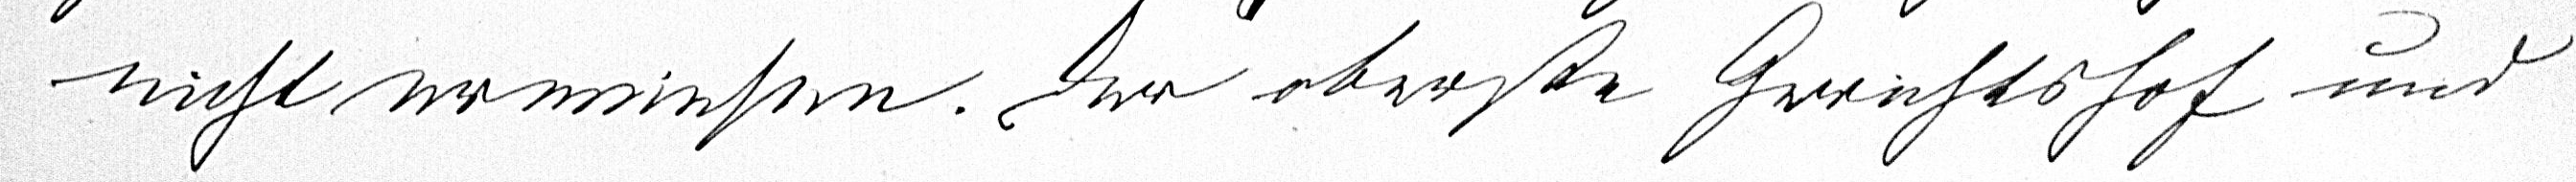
nicht erwiesen. Der oberste Gerichtshof und
